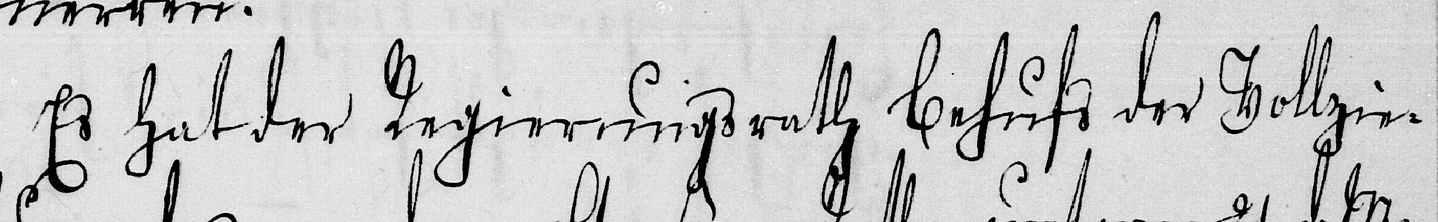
Es hat der Regierungsrath Behufs der Vollzi¬
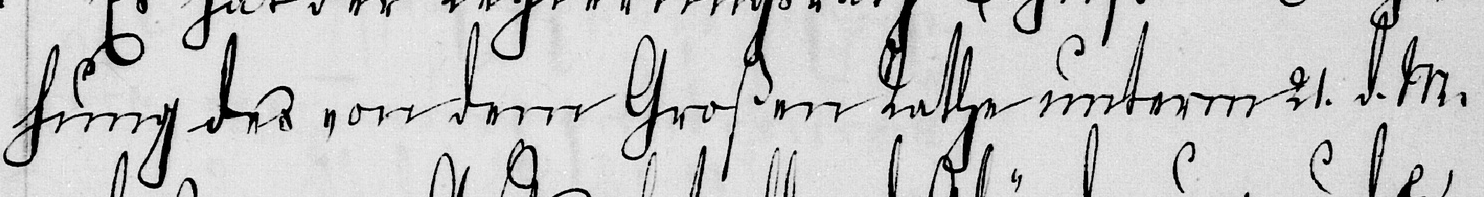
ehung des von dem Großen Rathe unterm 21. d. M.
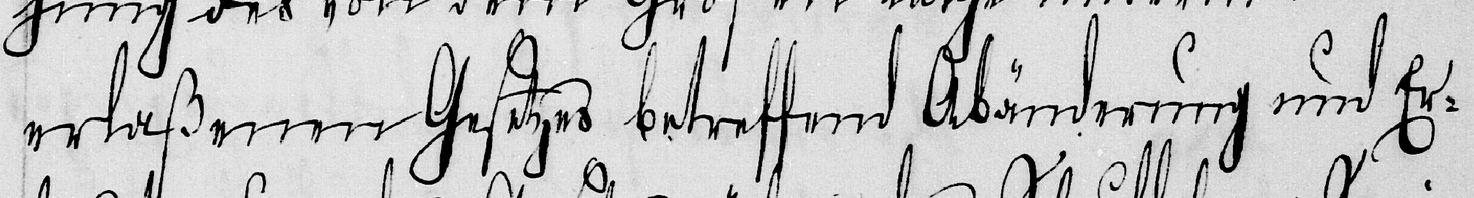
erlaßenen Gesetzes betreffend Abänderung und Er¬
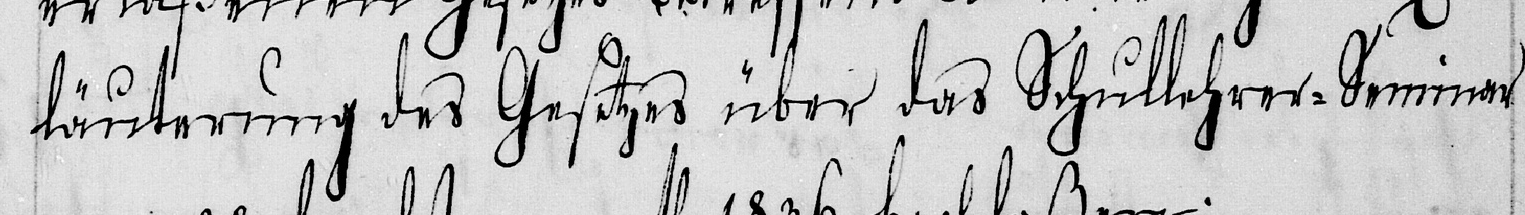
läuterung des Gesetzes über das Schullehrer-Seminar
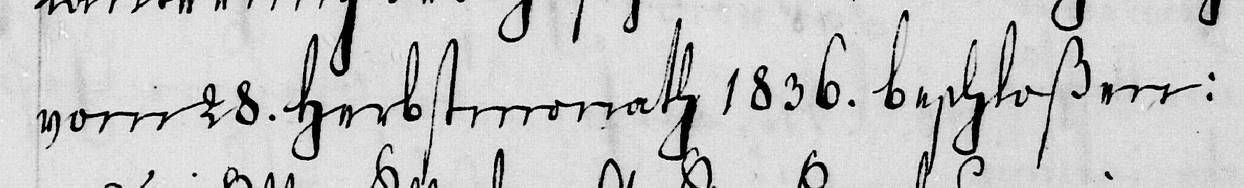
vom 28. Herbstmonath 1836. beschloßen:
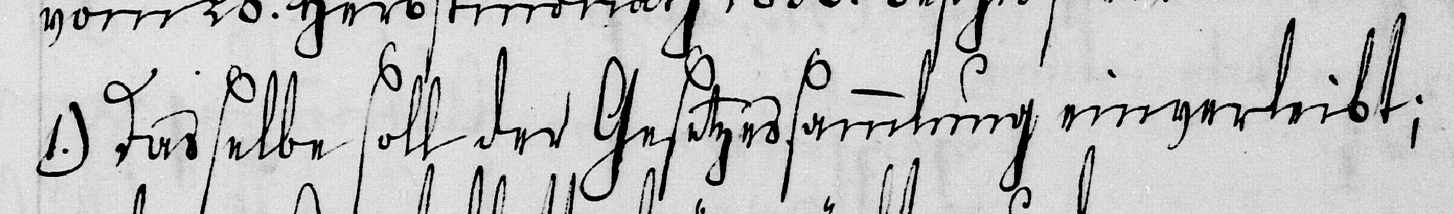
1.) Dasselbe soll der Gesetzessammlung einverleibt;
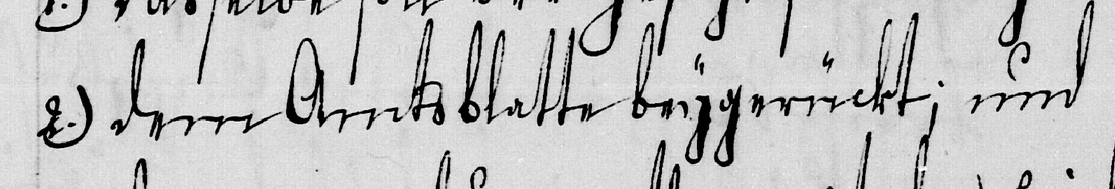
2.) dem Amtsblatte beygerückt; und
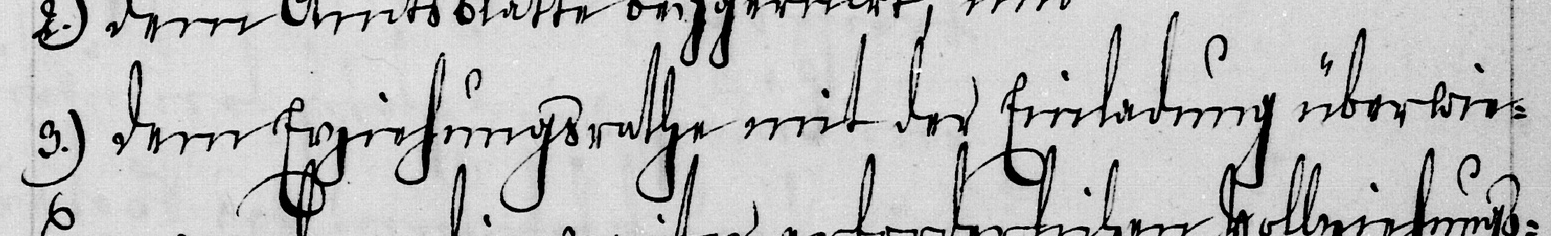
3.) dem Erziehungsrathe mit der Einladung überwie¬
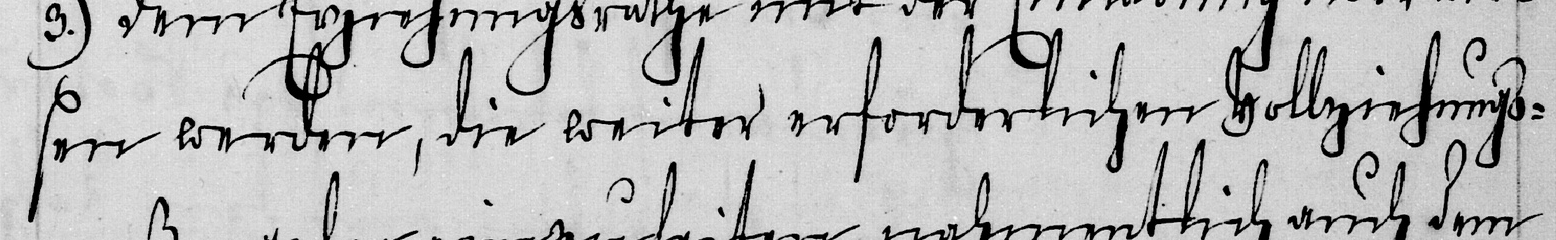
sen werden, die weiter erforderlichen Vollziehungs¬
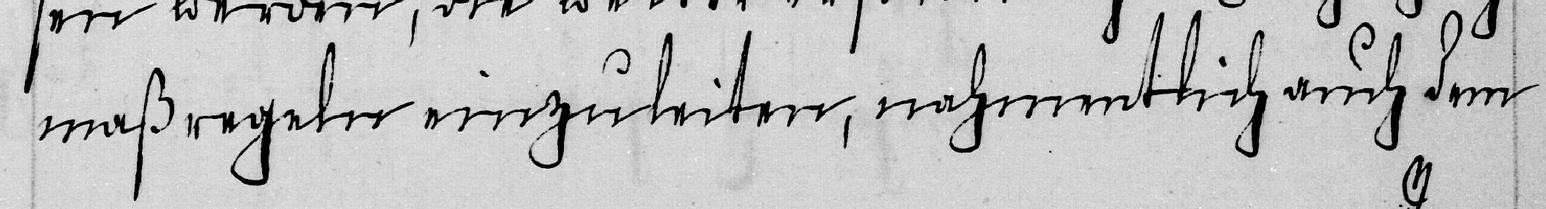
maßregeln einzuleiten, nahmentlich auch dem
